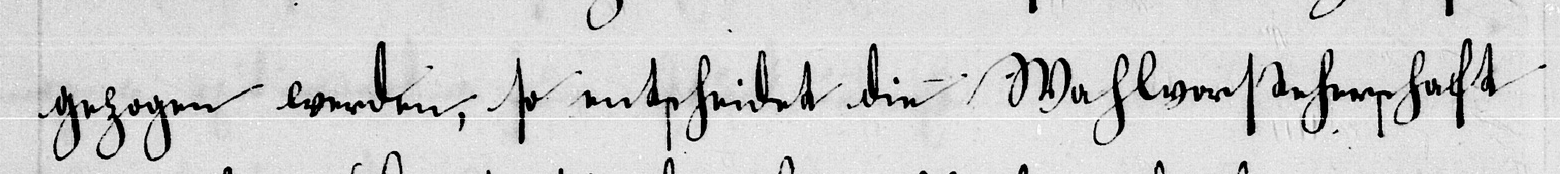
gezogen werden, so entscheidet die Wahlvorsteherschaft
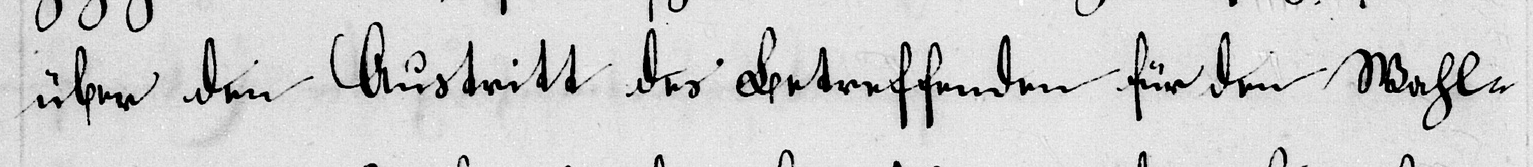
über den Austritt des Betreffenden für den Wahl¬
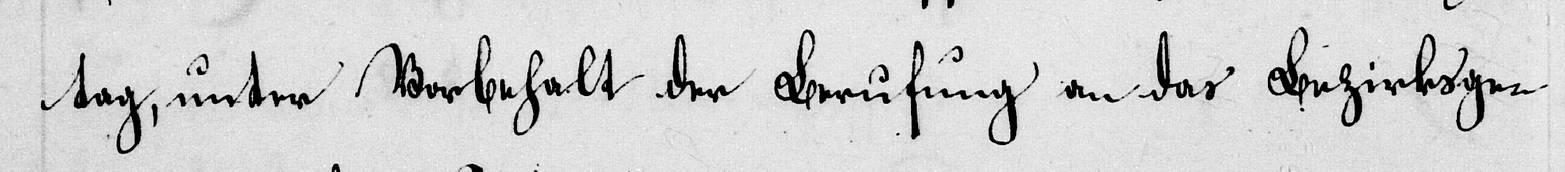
tag, unter Vorbehalt der Berufung an das Bezirksge¬
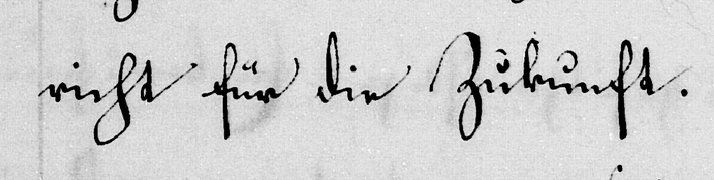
richt für die Zukunft.
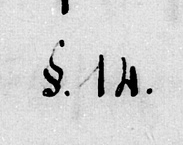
§.14.
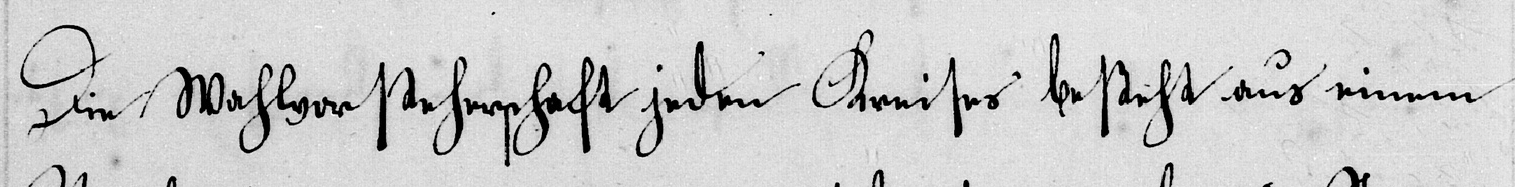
Die Wahlvorsteherschaft jeden Kreises besteht aus einem
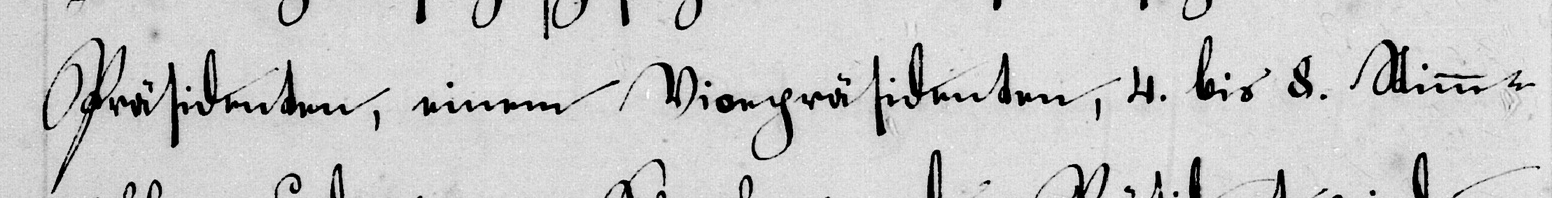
Präsidenten, einem Vicepräsidenten, 4. bis 8. Stimm¬
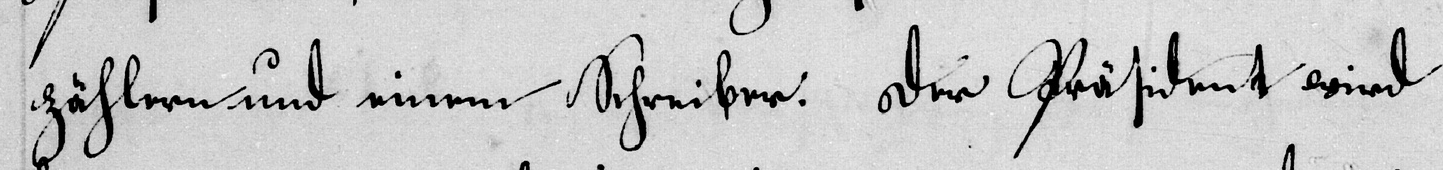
zählern und einem Schreiber. Der Präsident wird
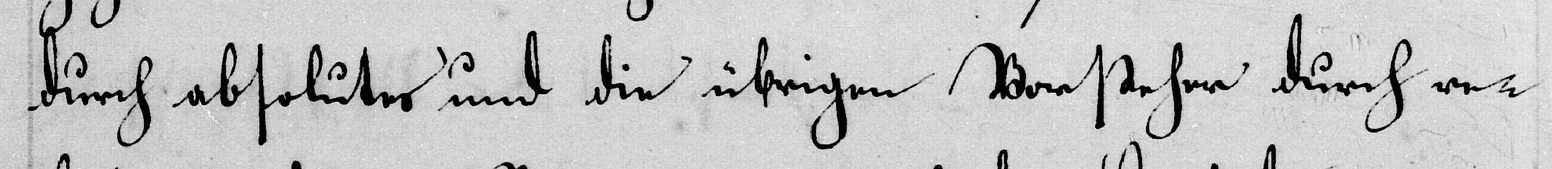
durch absolutes und die übrigen Vorsteher durch re¬
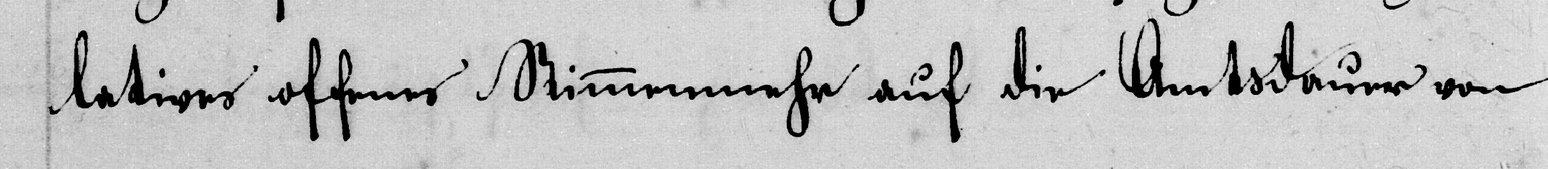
latives offenes Stimmenmehr auf die Amtsdauer von
